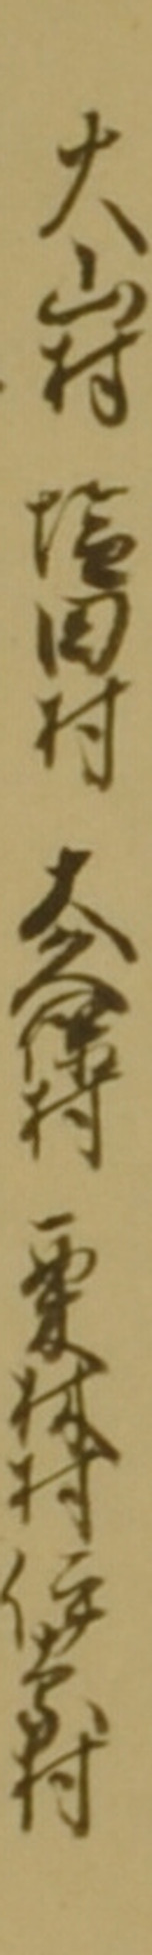火山村塩田村大久保村栗林村伊奈村
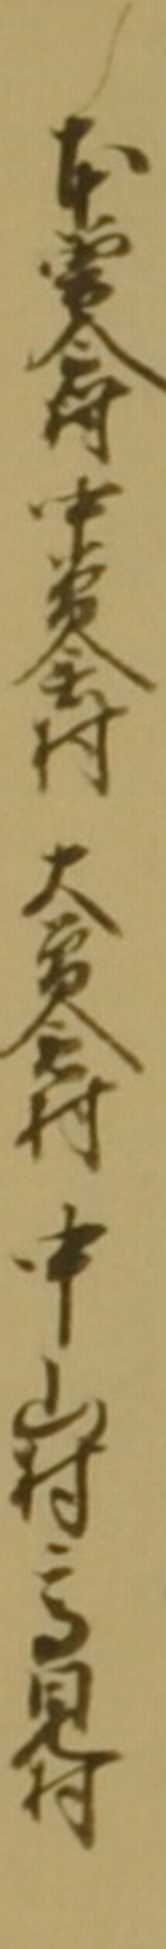本曽倉村中曽倉村大曽倉村中山村高見村
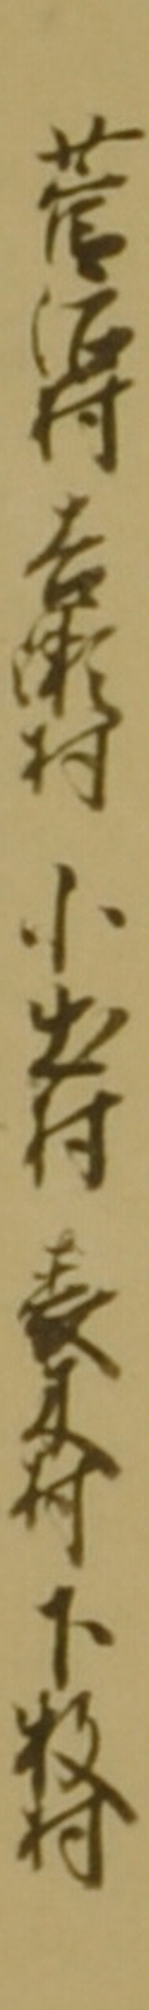菅沼村吉瀬村小出村表木村下牧村
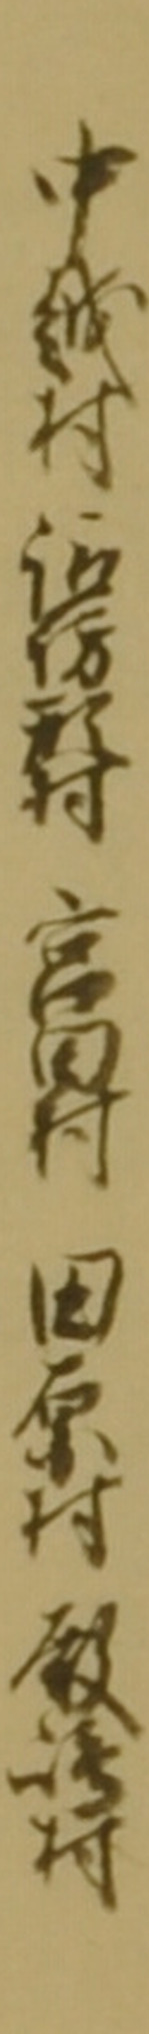中越村諏訪那村宮田村田原村殿島村
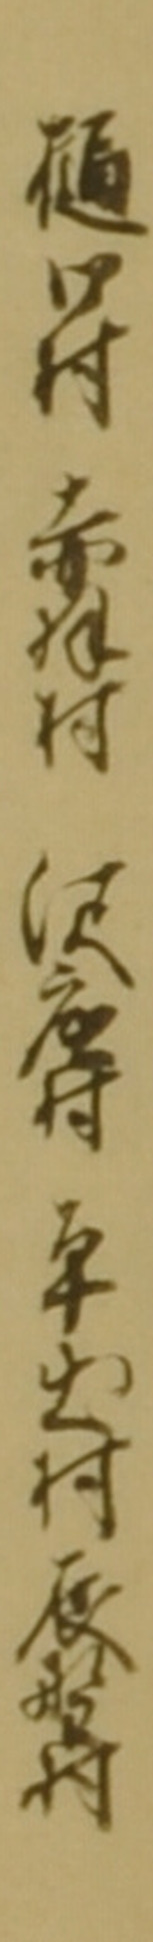樋口村赤羽村沢底村平出村辰野村

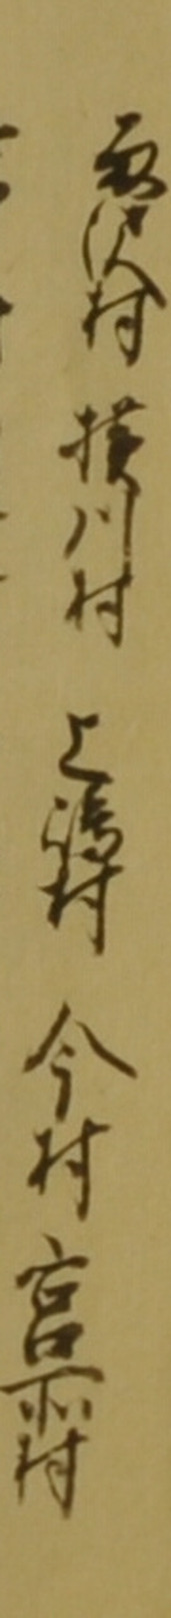雨沢村横川村上島村今村宮所村
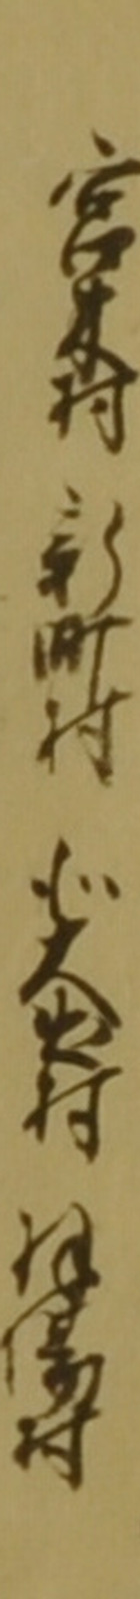宮木村新町村北大出村羽場村
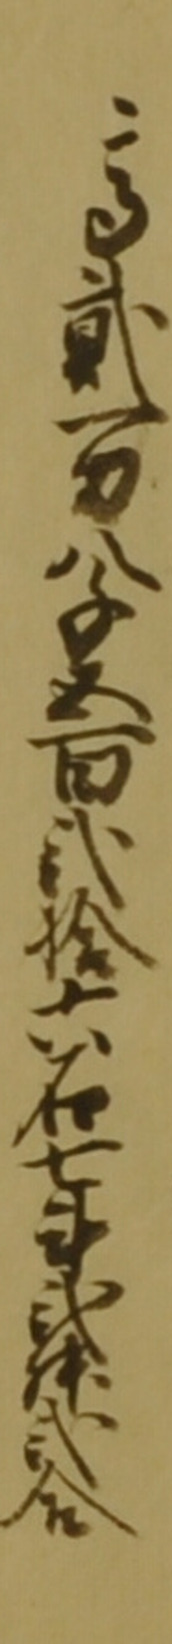高弐万八千五百弐拾六石七斗弐升弐合
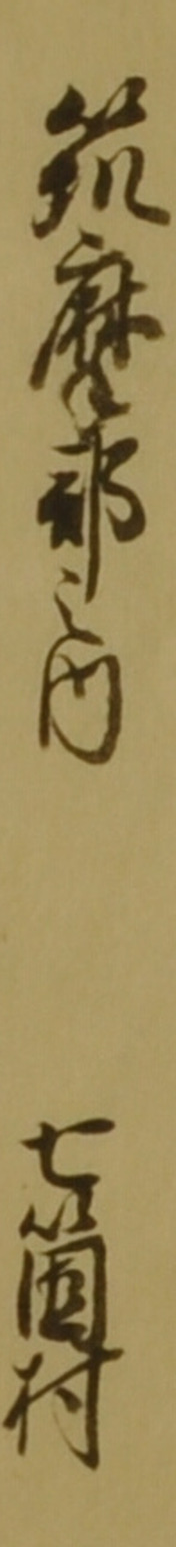筑摩郡之内七箇村
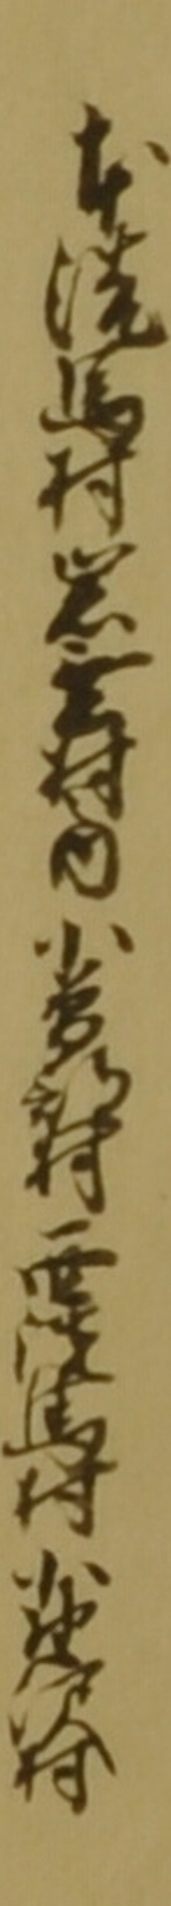本洗馬村岩垂村之内小曽部村西洗馬村小野沢村
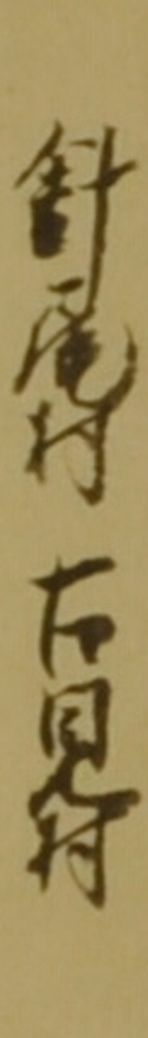針尾村古見村
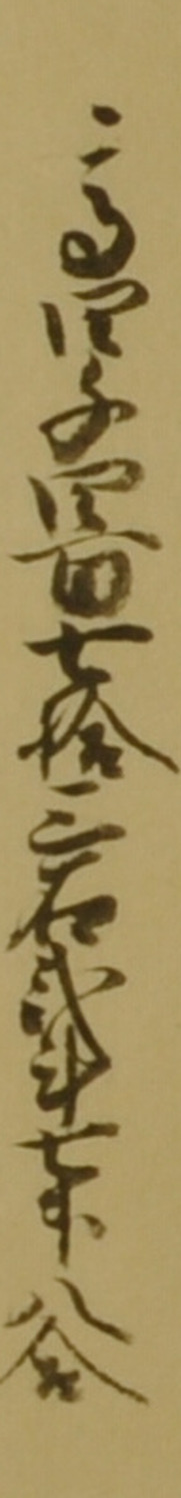高四千四百七拾三石弐斗七升八合
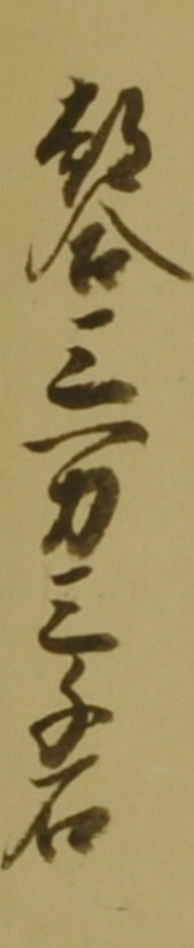都合三万三千石
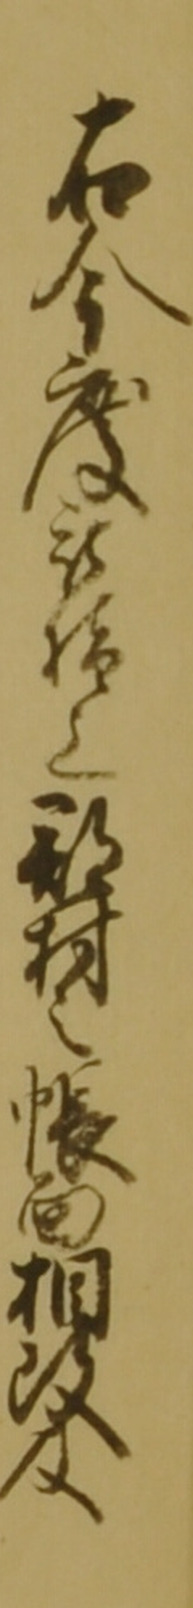右今度被指上郡村之帳面相改及
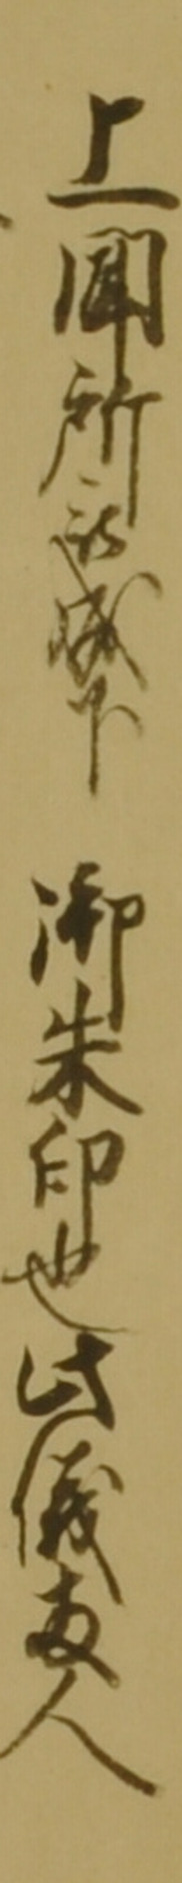上聞所被成下御朱印也此儀両人
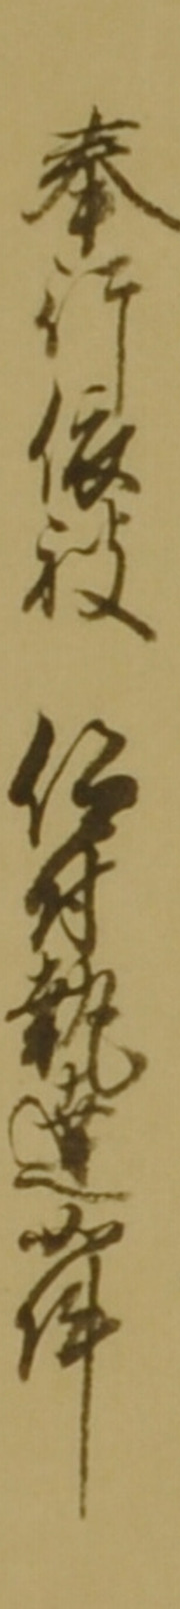奉行依被仰付執達如件
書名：御朱印・領地目録写
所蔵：伊那市立高遠町図書館・合同会社AMANE
